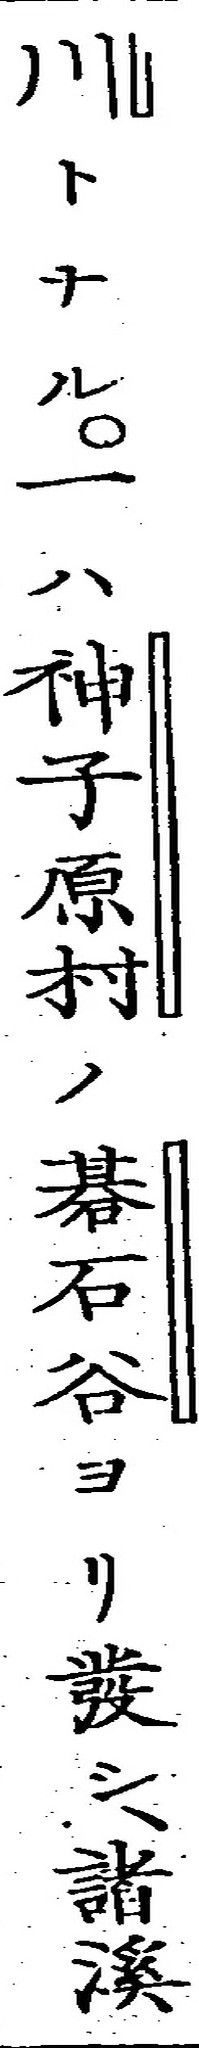川トナル。一ハ神子原村ノ碁石谷ヨリ発シ、諸渓
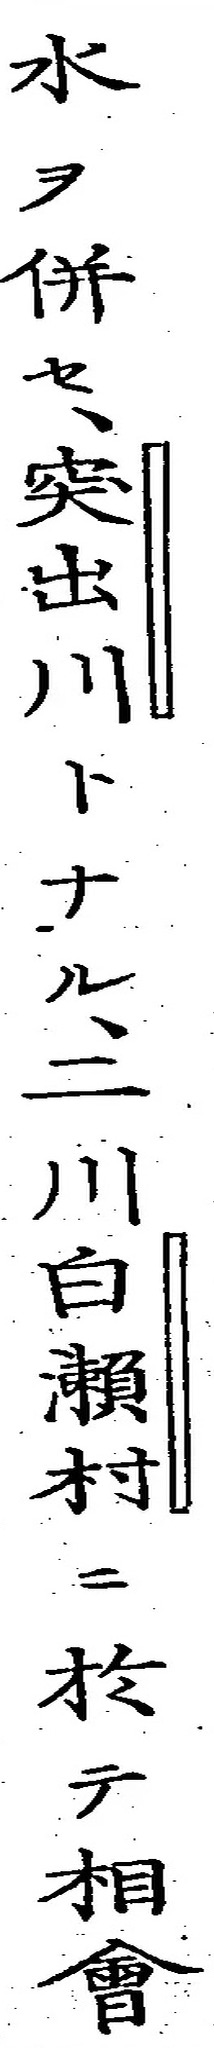水ヲ併セ、突出川トナル、二川白瀬村ニ於テ相会
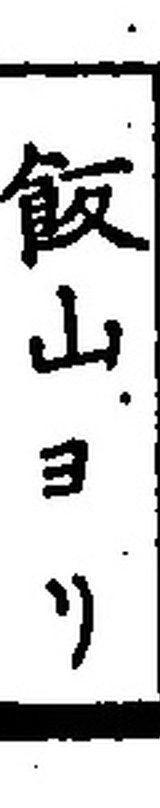飯山ヨリ
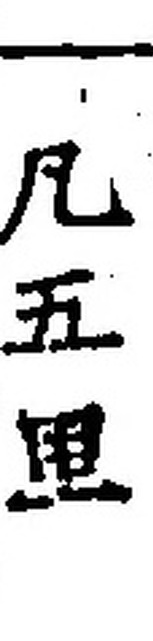凡五里
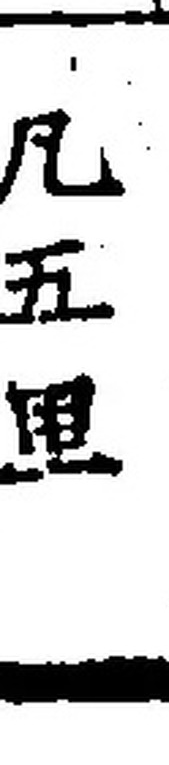凡五里
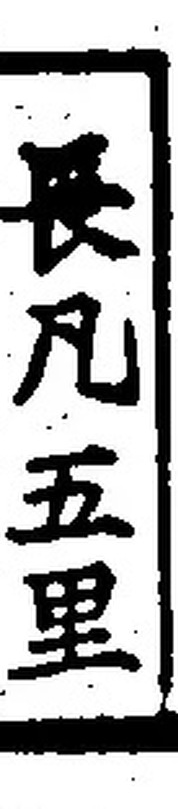長凡五里
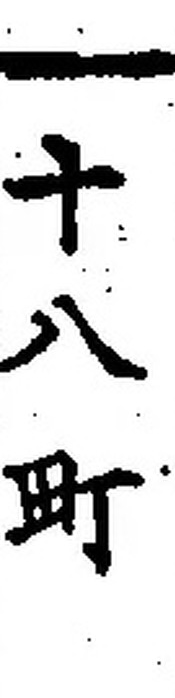十八町
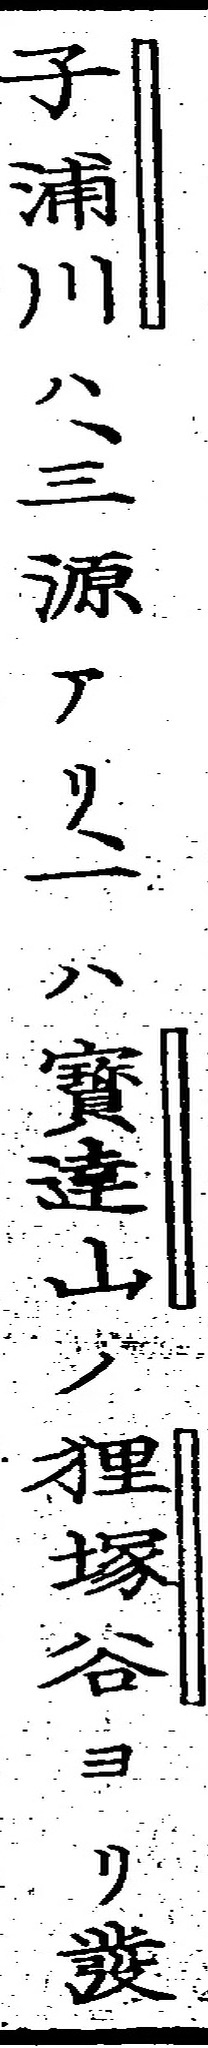子浦川ハ、三源アリ、一ハ宝達山ノ狸塚谷ヨリ発
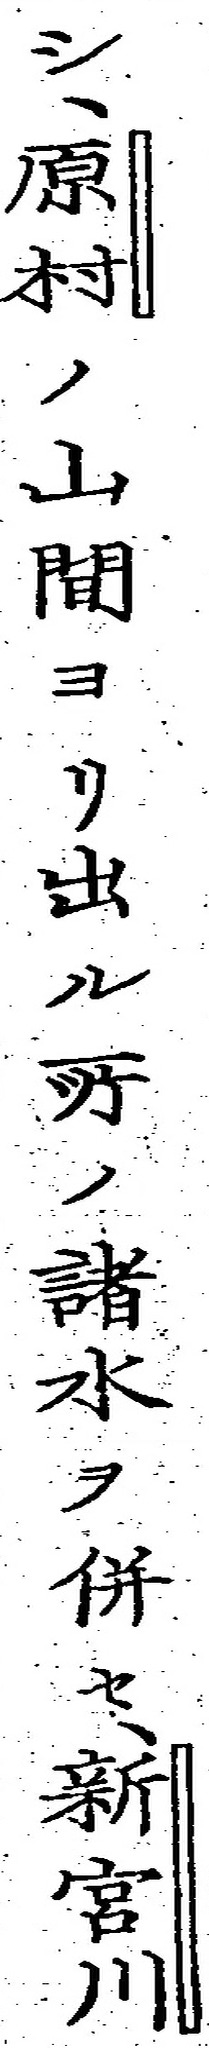シ、原村ノ山間ヨリ出ル所ノ諸水ヲ併セ、新宮川
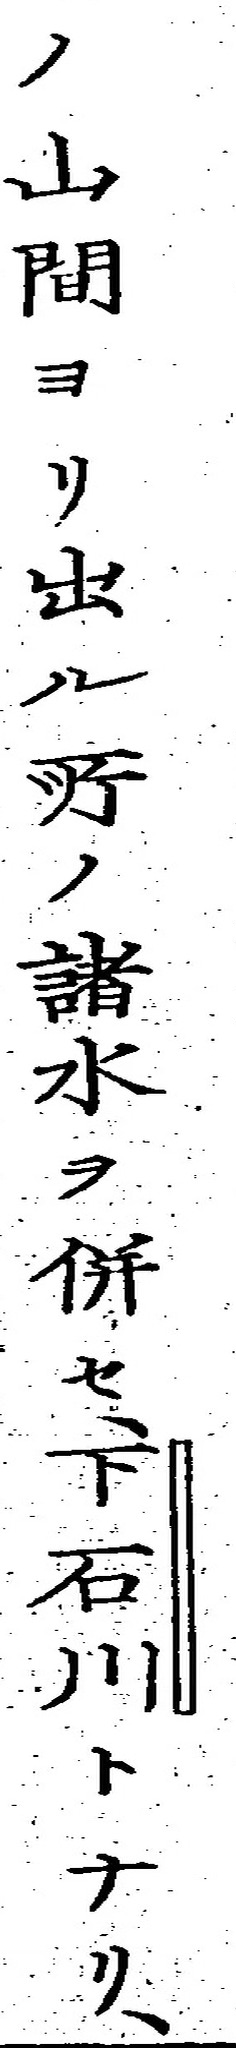ノ山間ヨリ出ル所ノ諸水ヲ併セ、下石川トナリ、
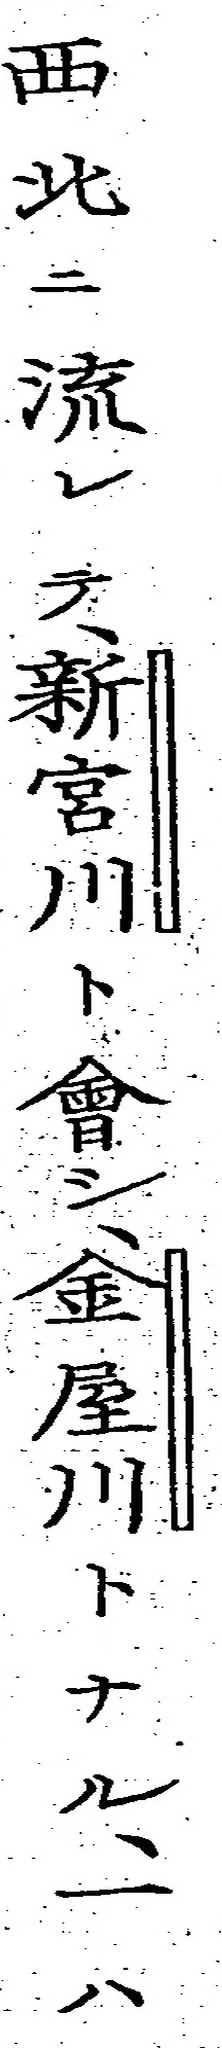西北ニ流レテ、新宮川ト会シ、金屋川トナル、一ハ
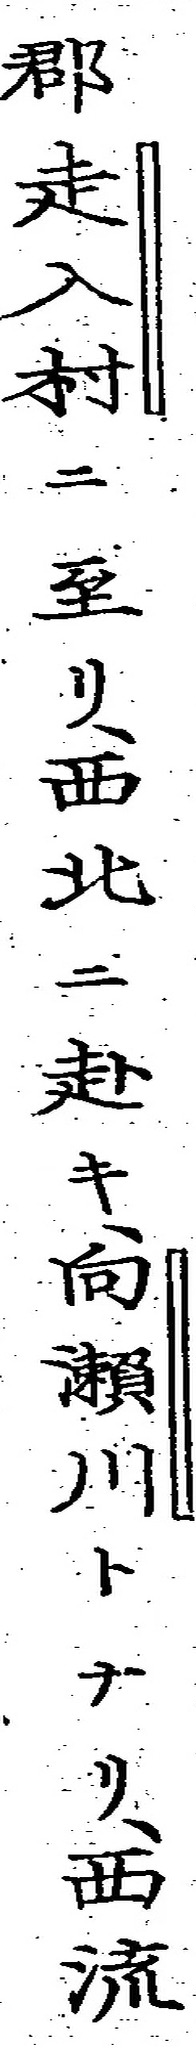郡走入村ニ至リ、西北ニ赴キ、向瀬川トナリ、西流
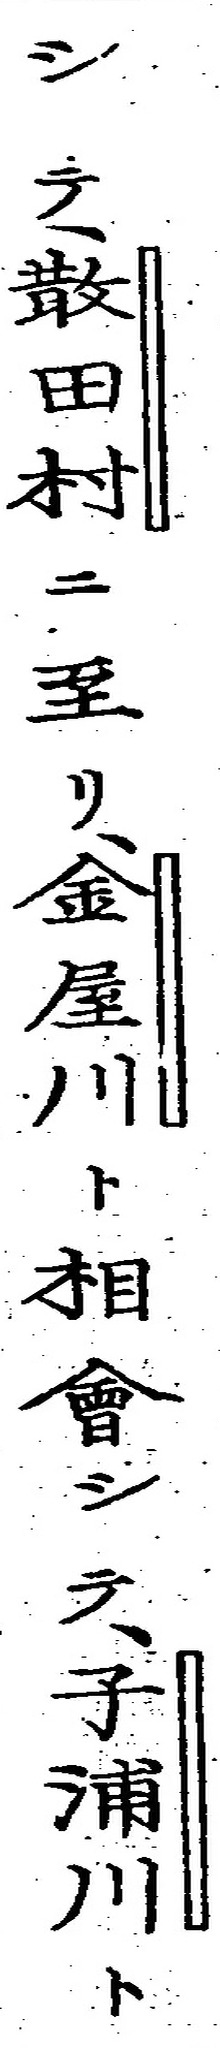シテ、散田村ニ至リ、金屋川ト相会シテ、子浦川ト
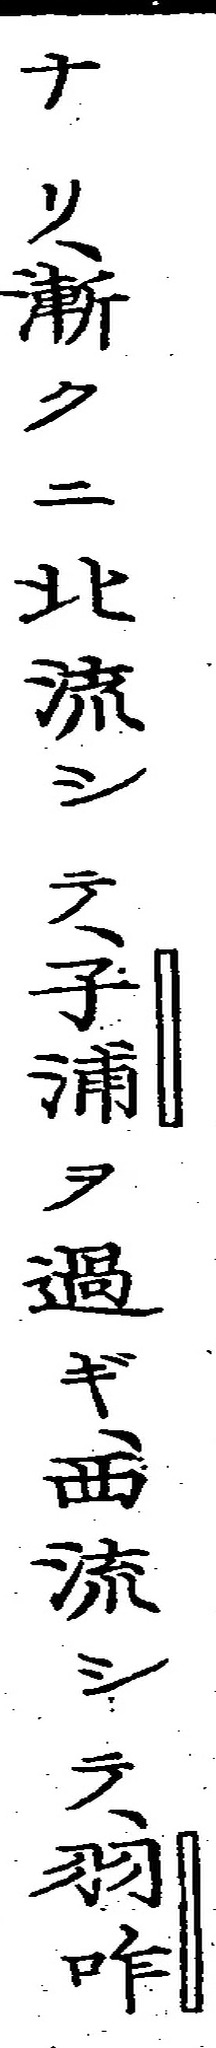ナリ、漸クニ北流シテ、子浦ヲ過ギ、西流シテ、羽咋
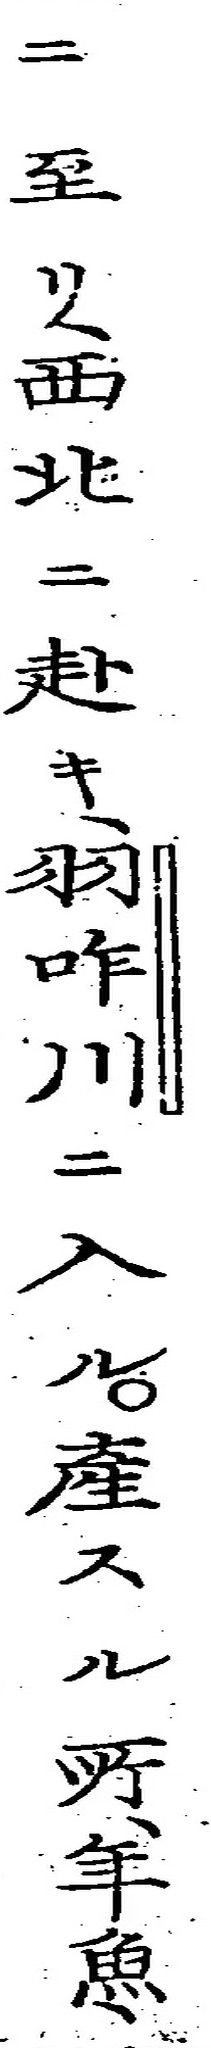ニ至リ、西北ニ赴キ、羽咋川ニ入ル。産スル所、年魚・

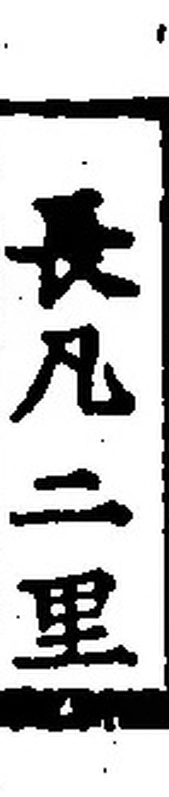長凡二里
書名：能登地誌略
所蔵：国立国会図書館 National Diet Library, JAPAN
